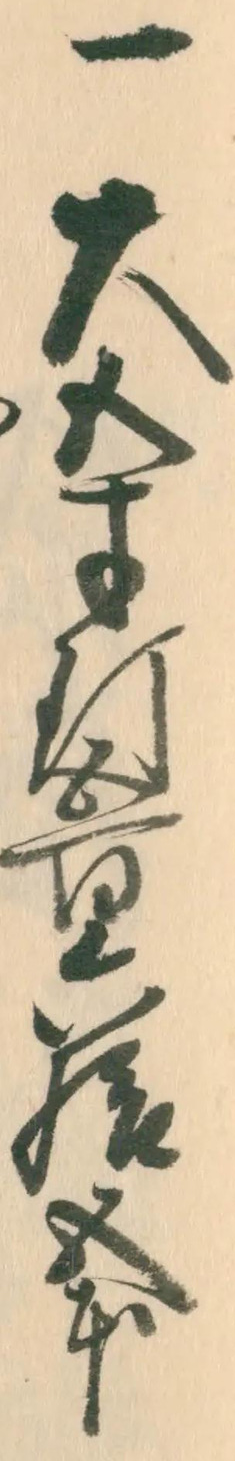一大五寸釘五百六拾五本
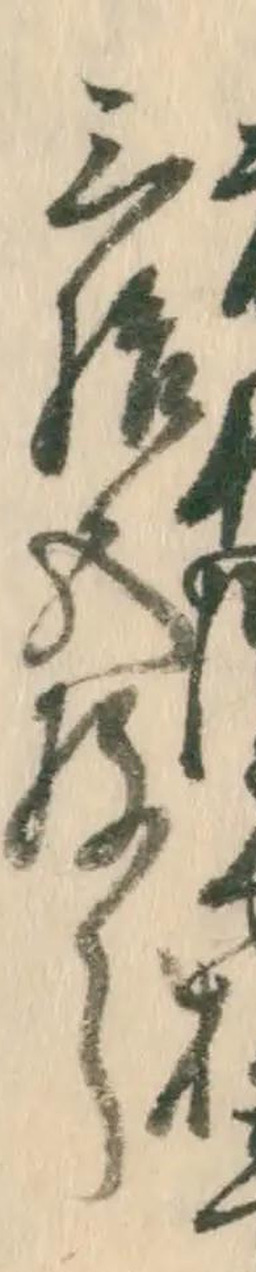三拾五枚分
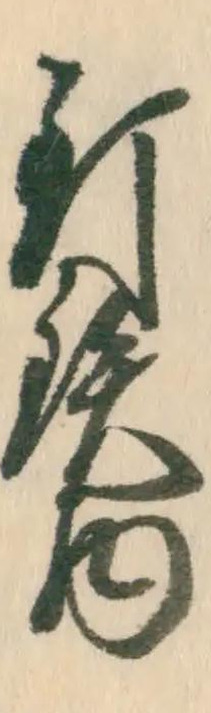釘鉄物
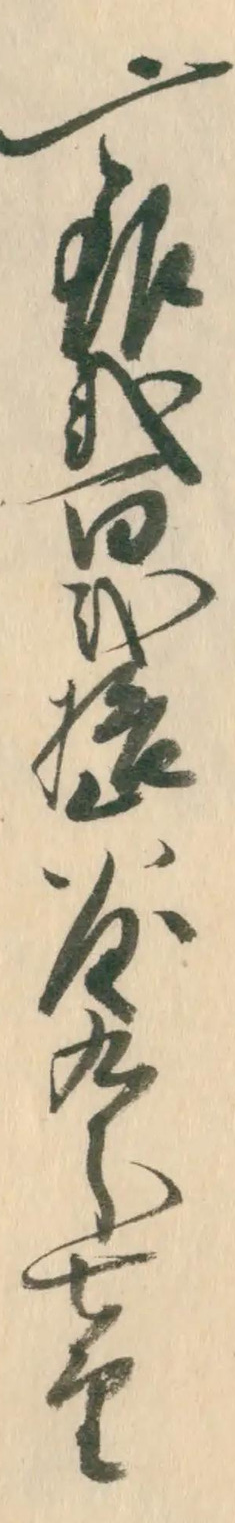〆銀弐百弐拾六匁九分七厘

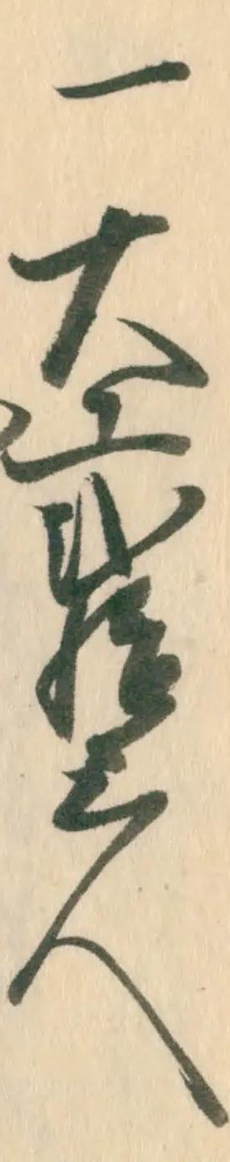一大工弐拾三人
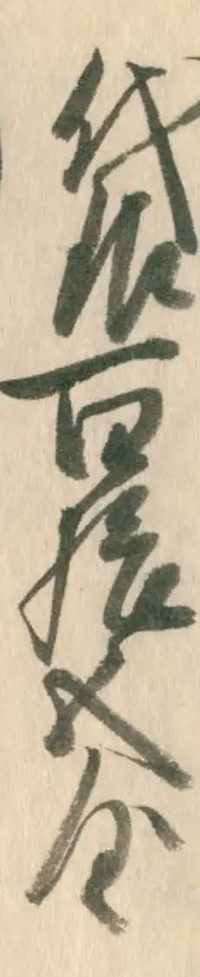代銀拾五匁
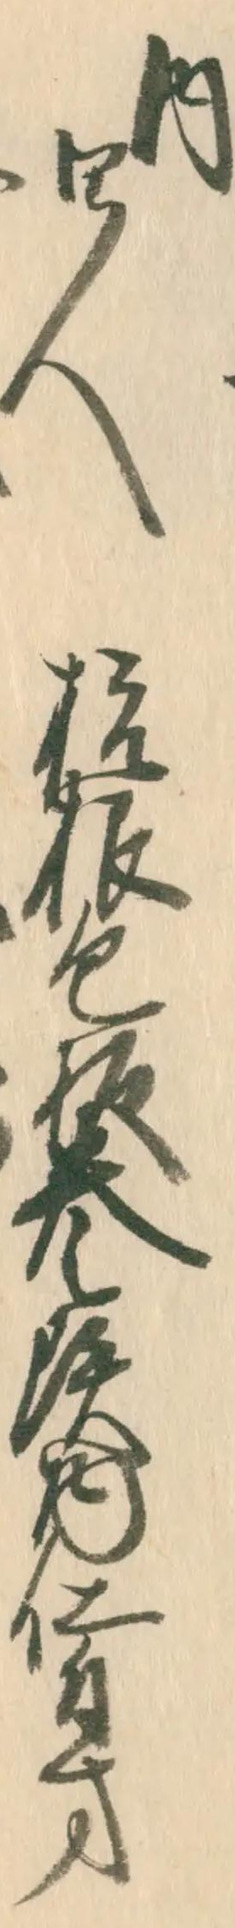四人杭根包板巻鉄物仕付方
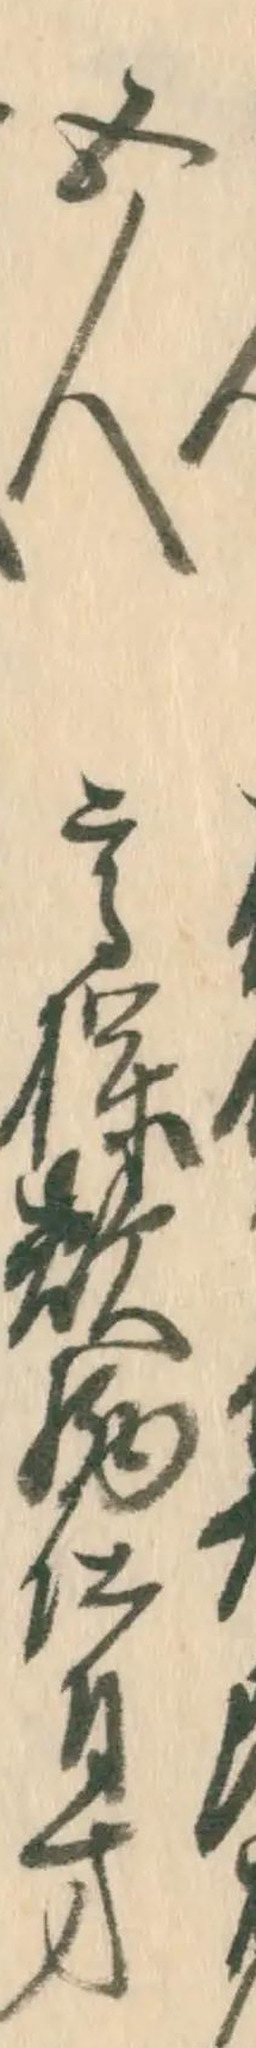五人高欄頬柄仕付方
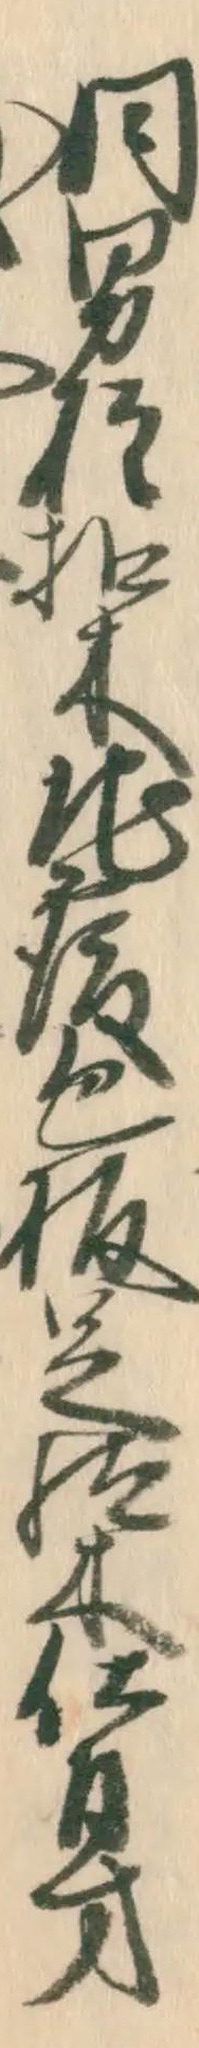四人同男柱扣木地覆包板足駄木仕付方
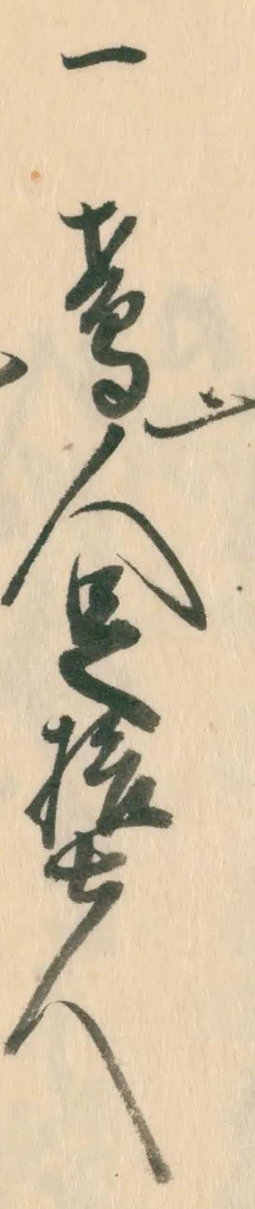一鳶人足拾七人
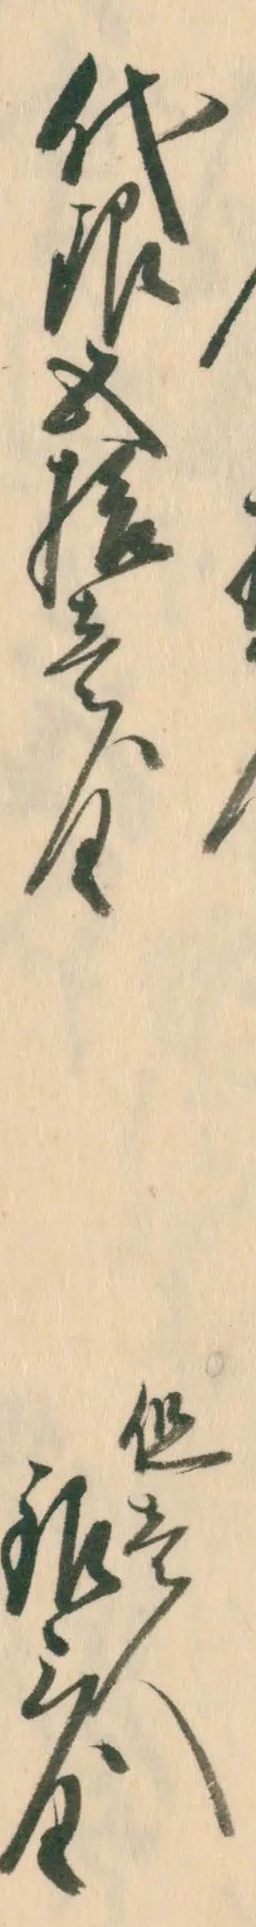代銀五拾壱匁但壱人銀三匁
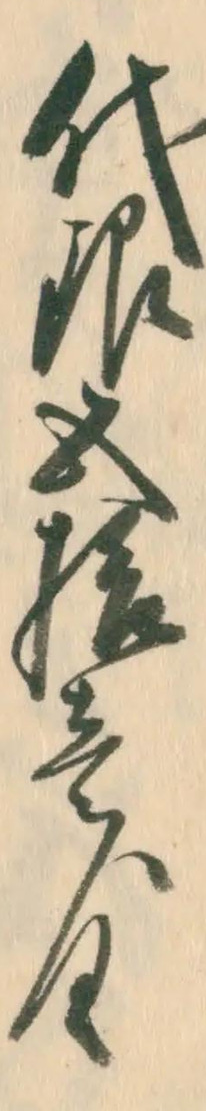代銀拾五匁
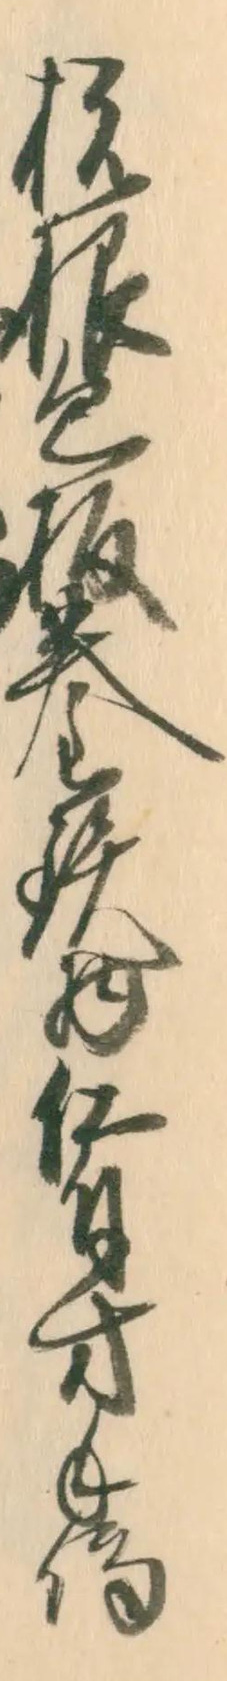四人杭根包板巻鉄物仕付方手伝
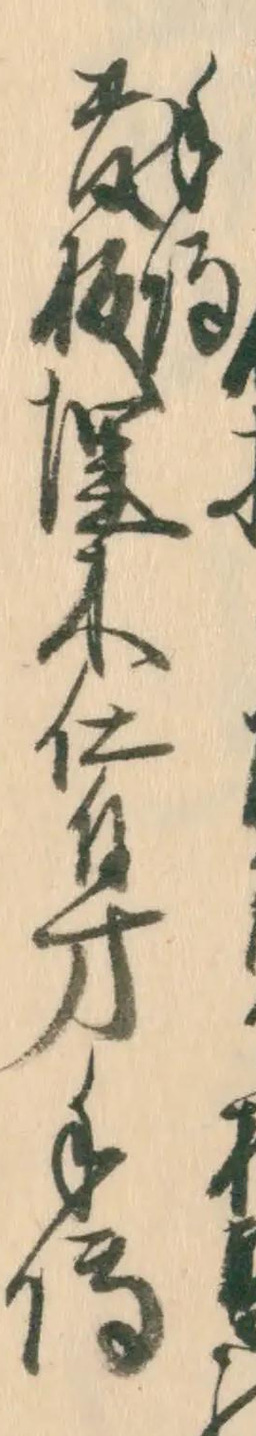五人敷板埋木仕付方手伝
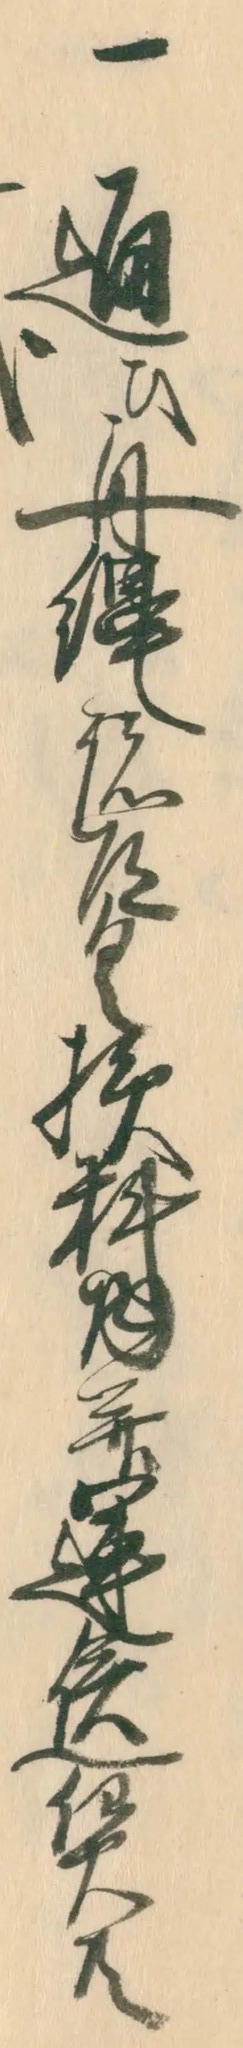一通ひ舟縄諸道具損料物并運送賃共
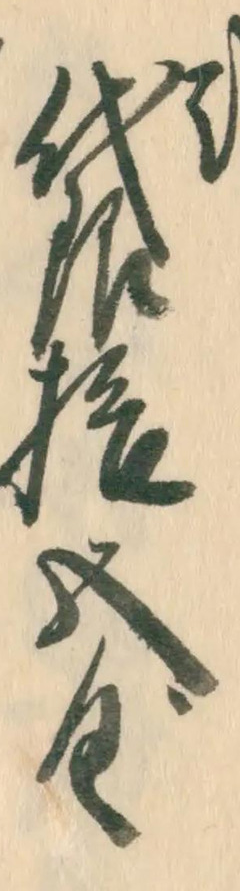代銀拾五匁
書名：三橋 17巻. [8] 三橋小破御修復書留　但御奉行御掛リ替地震潰橋番屋　嘉永四亥年より安政二卯年迄　下
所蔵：国立国会図書館 National Diet Library, JAPAN
